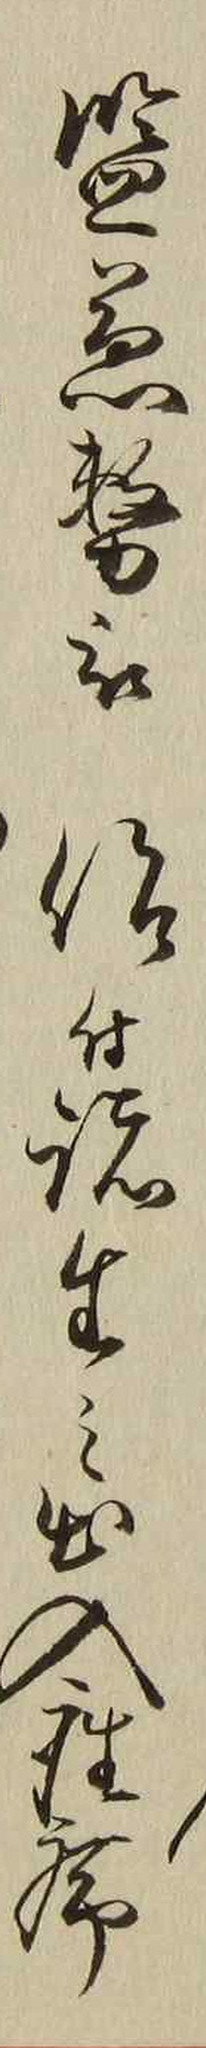監兼務被仰付諸生之出入座席
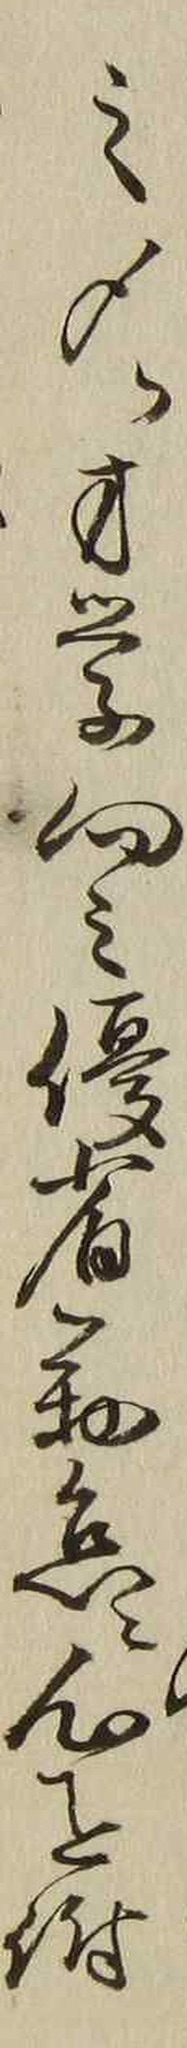之〆り方学向之優省勤怠ニ心を附
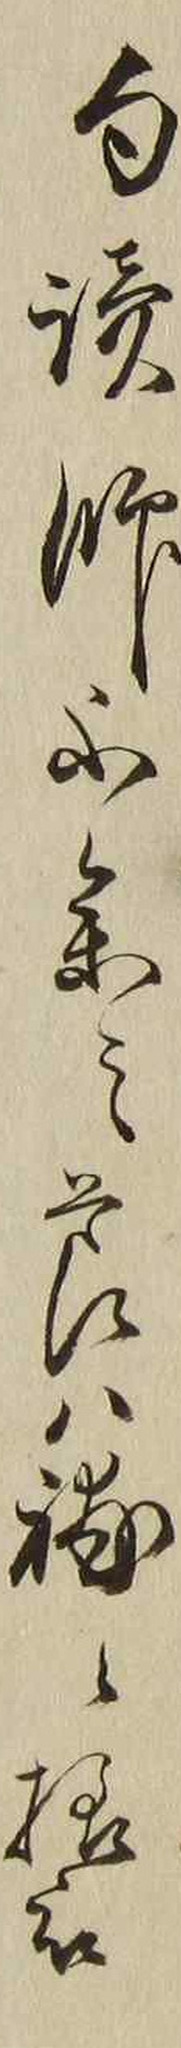句読師不参之節ハ補候様被
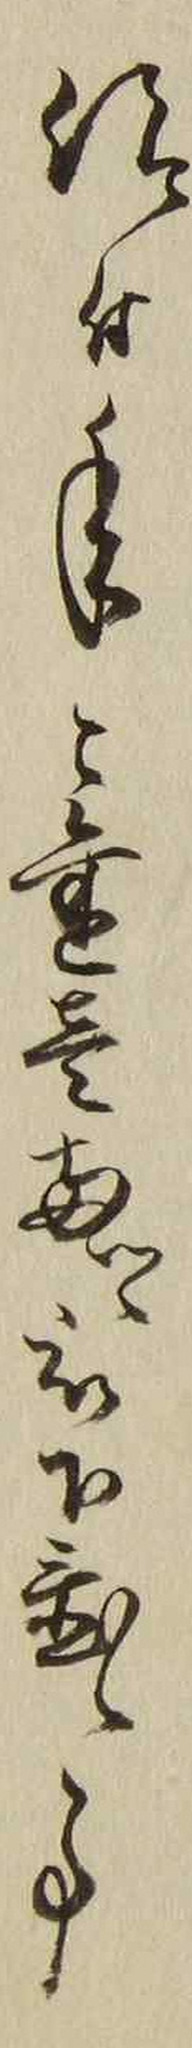仰付年々金壱両ツヽ被下置候事

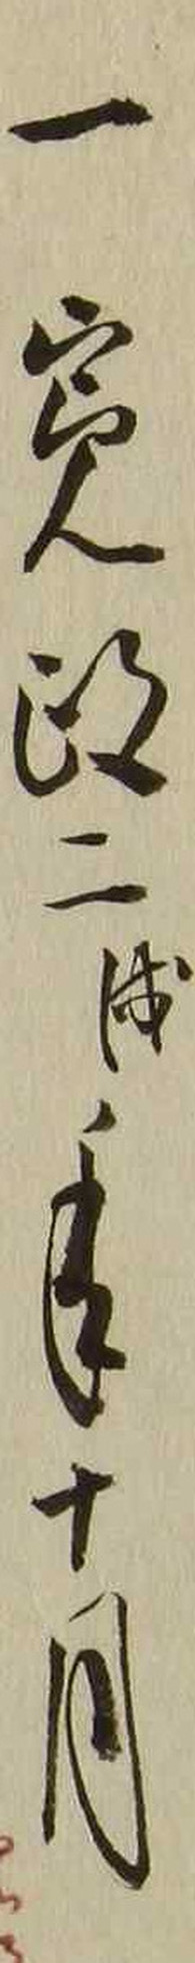一寛政二戌年十月
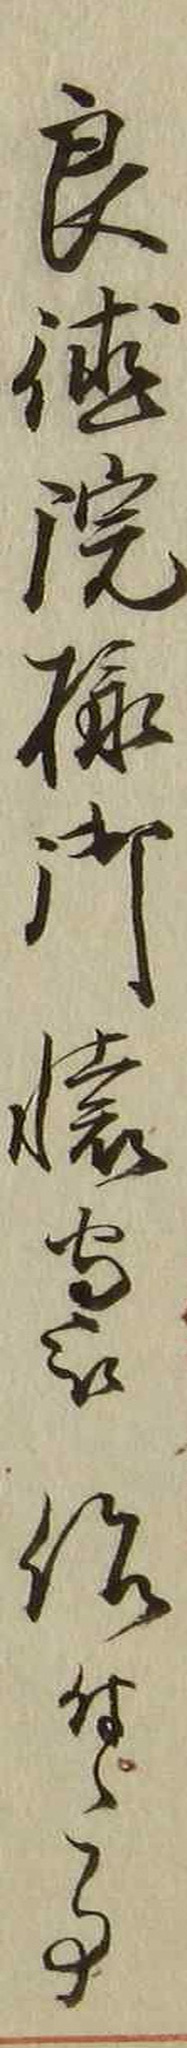良徳院様御懐守被仰付◦候事
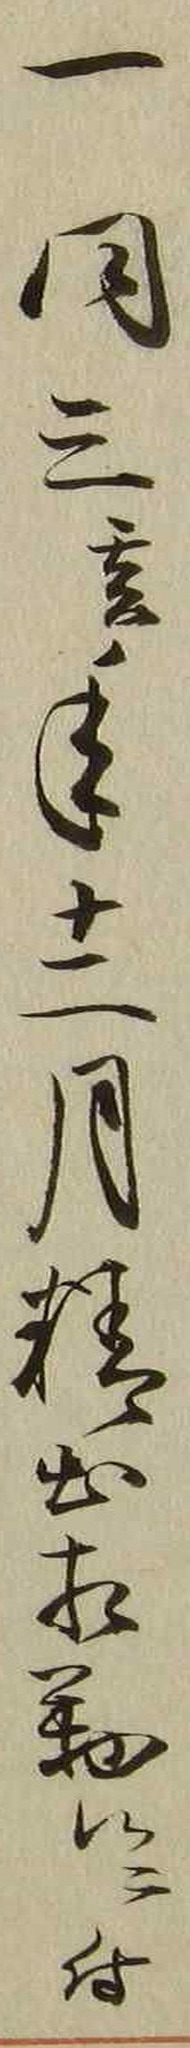一同三亥年十二月精出相勤候ニ付
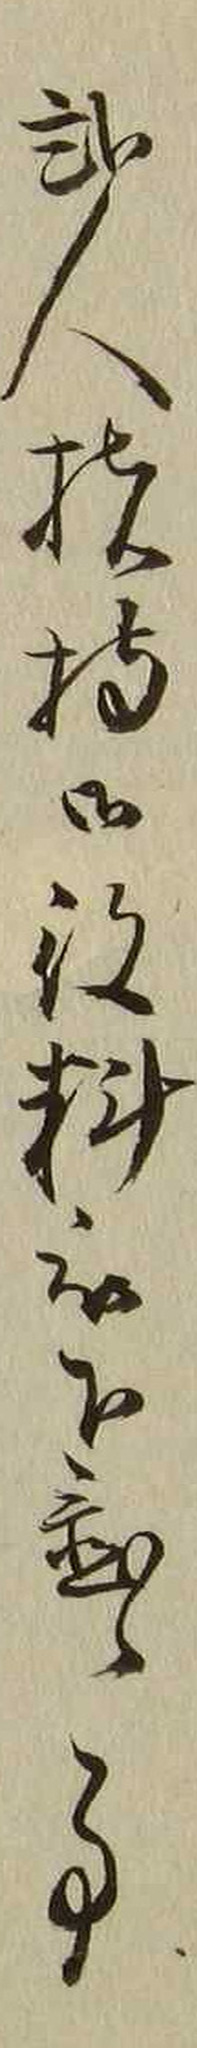弐人扶持御役料被下置候事
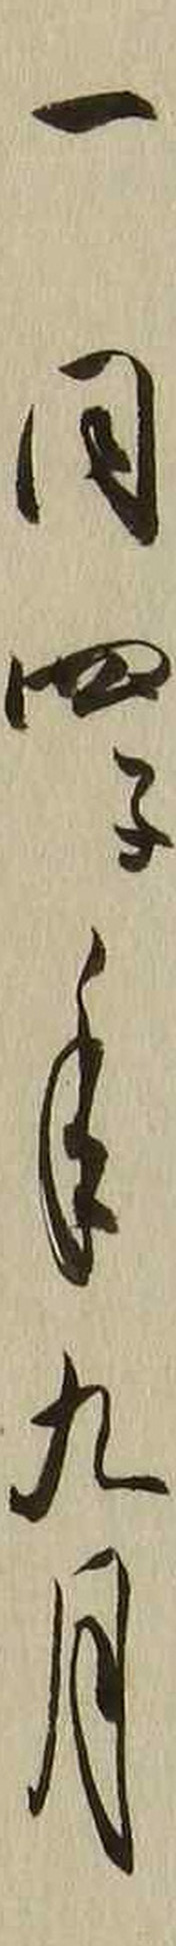一同四子年九月
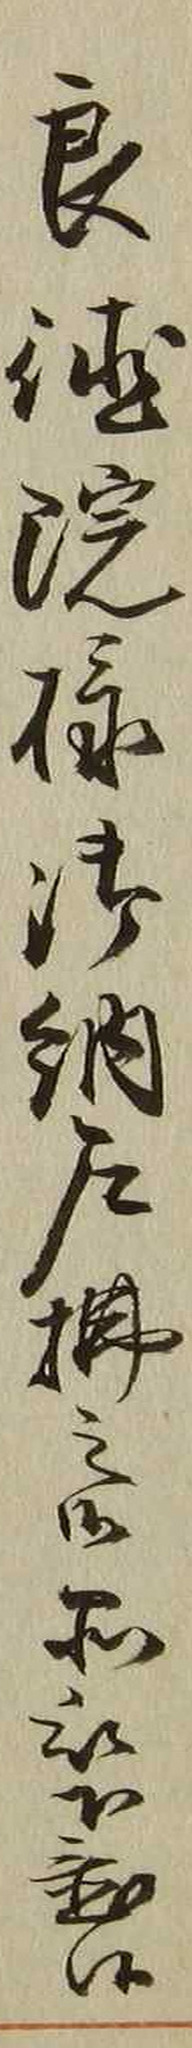良徳院様御納戸払之御品被下置候
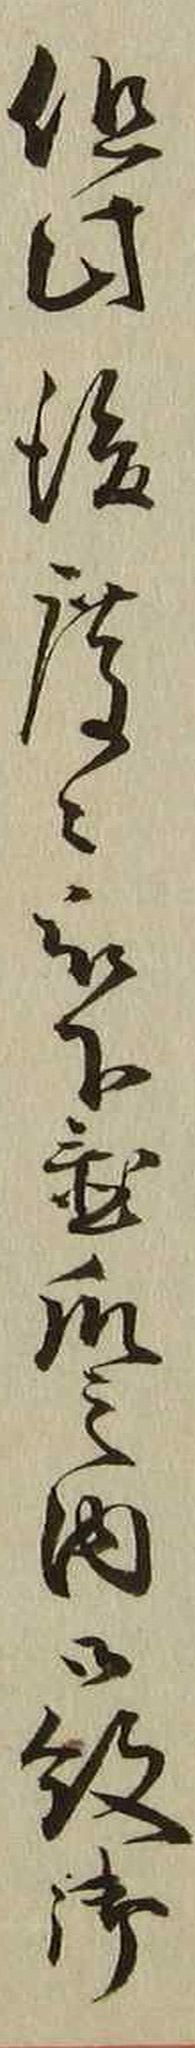但此後度々被下置瓜之内御紋御
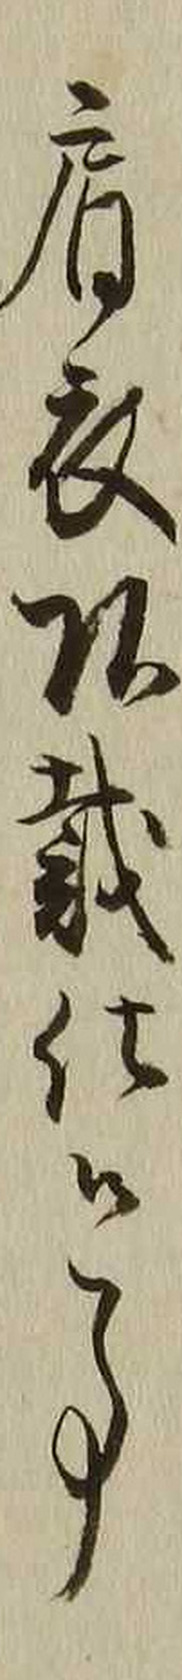肩衣頂戴仕候事
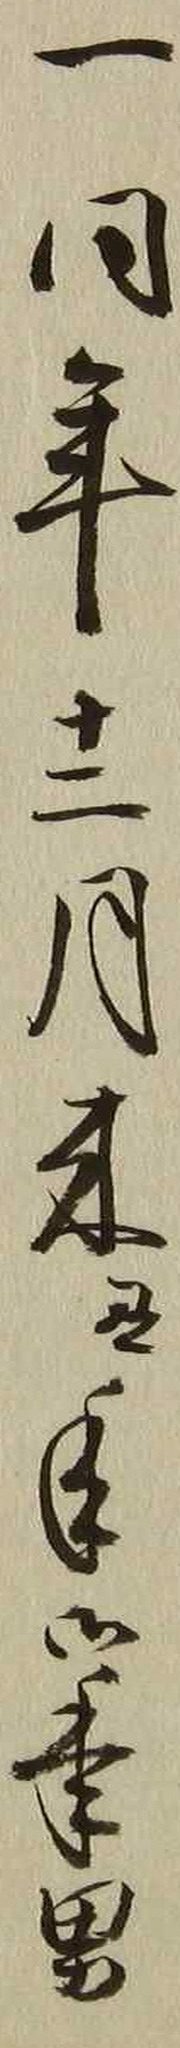一同年十二月来丑年御年男
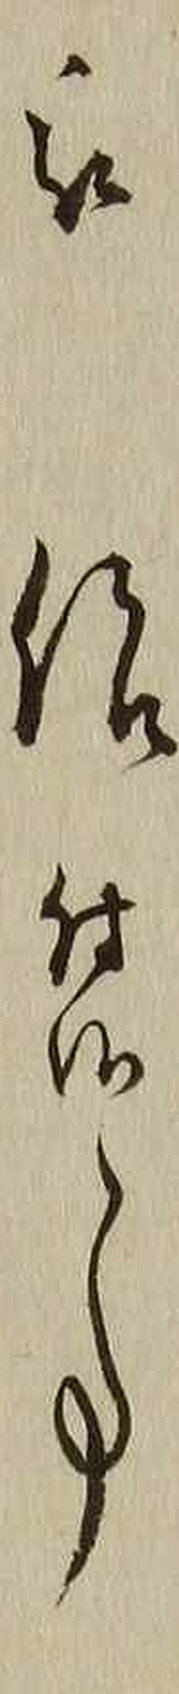被仰付候事
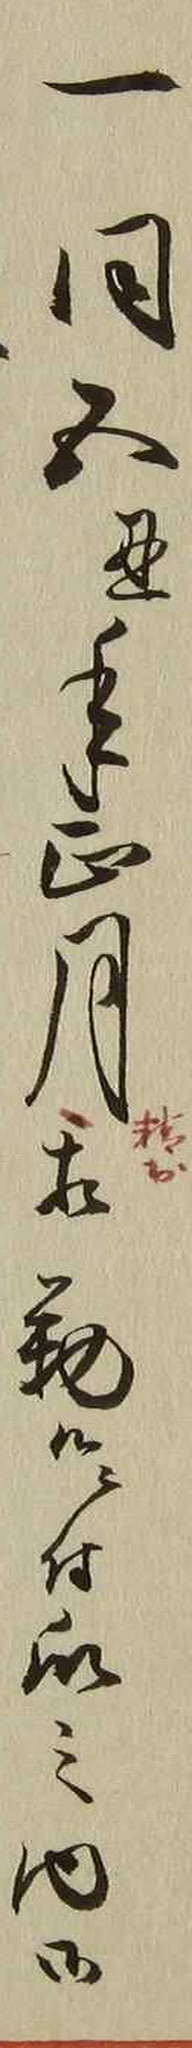一同五丑年正月相勤候ニ付瓜之内御
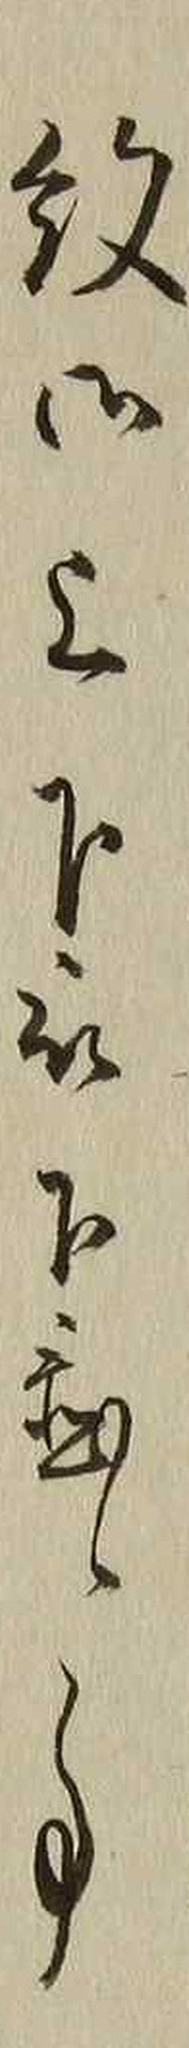紋御上下被下置候事
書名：諸士系譜　巻之57　ほ之部4
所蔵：会津若松市立会津図書館
